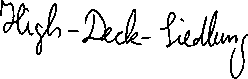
High-Deck-Siedlung
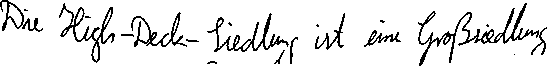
Die High-Deck-Siedlung ist eine Großsiedlung
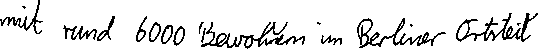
mit rund 6000 Bewohnern im Berliner Ortsteil
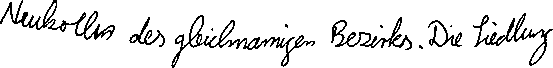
Neukölln des gleichnamigen Bezirks. Die Siedlung
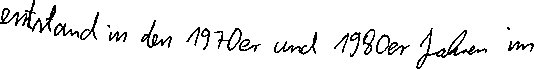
entstand in den 1970er und 1980er Jahren im
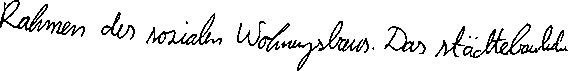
Rahmen des sozialen Wohnungsbaus. Das städtebauliche
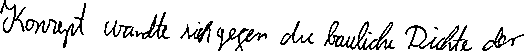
Konzept wandte sich gegen die bauliche Dichte der
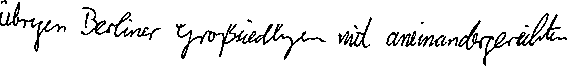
übrigen Berliner Großsiedlungen mit aneinandergereihten
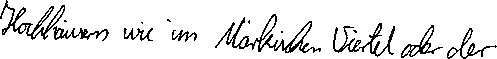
Hochhäusern wie im Märkischen Viertel oder der
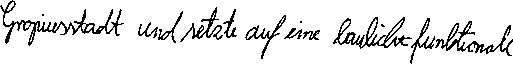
Gropiusstadt und setzte auf eine baulichfunktionale
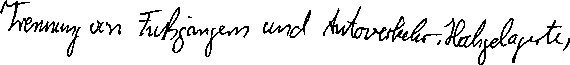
Trennung von Fußgängern und Autoverkehr. Hochgelagerte,
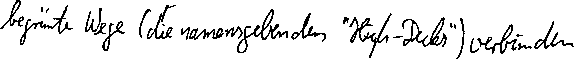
begrünte Wege (die namensgebenden "High-Decks") verbinden
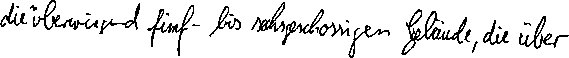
die überwiegend fünf- bis sechsgeschossigen Gebäude, die über
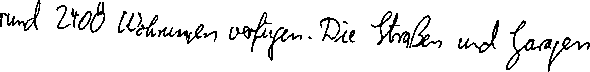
rund 2400 Wohnungen verfügen. Die Straßen und Garagen
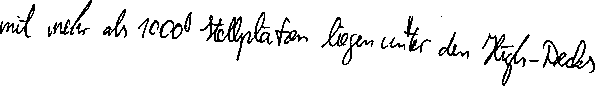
mit mehr als 1000 Stellplätzen liegen unter den High-Decks.
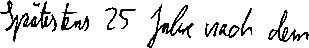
Spätestens 25 Jahre nach dem
